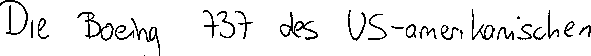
Die Boeing 737 des US-amerikanischen
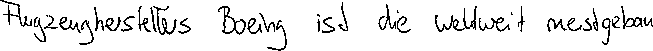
Flugzeugherstellers Boeing ist die weltweit meistgebau
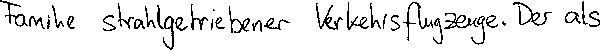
Familie strahlgetriebener Verkehrsflugzeuge. Der als
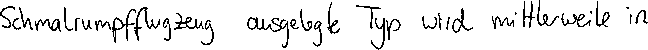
Schmalrumpfflugzeug ausgelegte Typ wird mittlerweile in
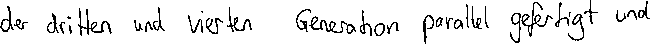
der dritten und vierten Generation parallel gefertigt und
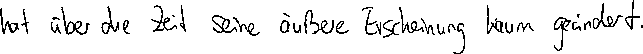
hat über die Zeit seine äußere Erscheinung kaum geändert.
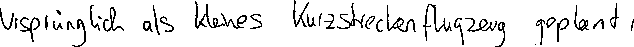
Ursprünglich als kleines Kurzstreckenflugzeug geplant,
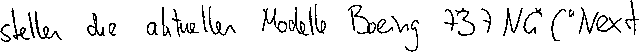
stellen die aktuellen Modelle Boeing 737NG ("Next
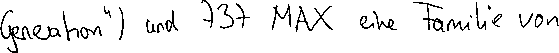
Generation") und 737 MAX eine Familie von
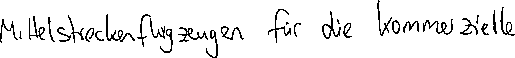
Mittelstreckenflugzeugen für die kommerzielle
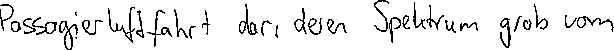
Passagierluftfahrt dar, deren Spektrum grob vom
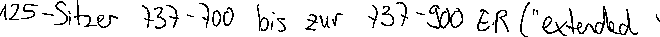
125-Sitzer 737-700 bis zur 737-900ER ("extended
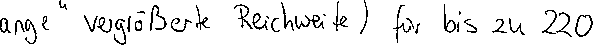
range" vergrößerte Reichweite) für bis zu 220
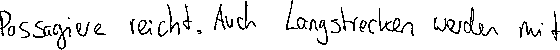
Passagiere reicht. Auch Langstrecken werden mit
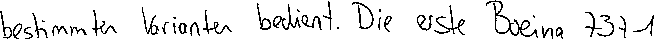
bestimmten Varianten bedient. Die erste Boeing 737-1
